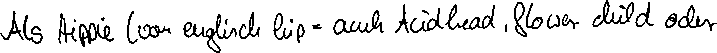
Als Hippie (von englisch hip = auch Acidhead, flower child oder
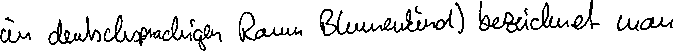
im deutschsprachigen Raum Blumenkind) bezeichnet man
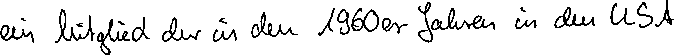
ein Mitglied der in den 1960er Jahren in den USA
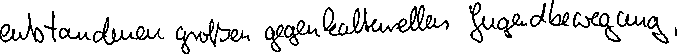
entstandenen großen gegenkulturellen Jugendbewegung,
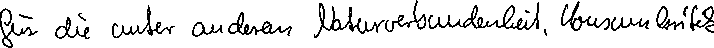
für die unter anderem Naturverbundenheit, Konsumkritik
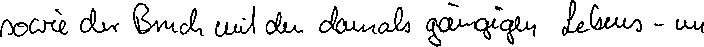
sowie der Bruch mit den damals gängigen Lebens- und
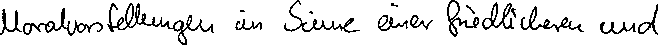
Moralvorstellungen im Sinne einer friedlicheren und
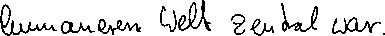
humaneren Welt zentral war.
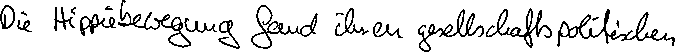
Die Hippiebewegung fand ihren gesellschaftspolitischen
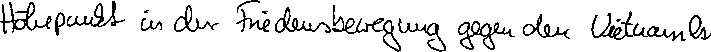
Höhepunkt in der Friedensbewegung gegen den Vietnamk
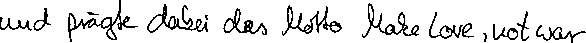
und prägte dabei das Motto Make love, not war
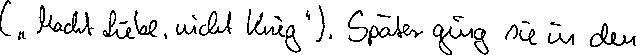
("Macht Liebe, nicht Krieg"). Später ging sie in den
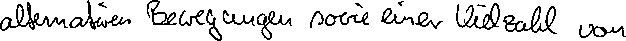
alternativen Bewegungen sowie einer Vielzahl von
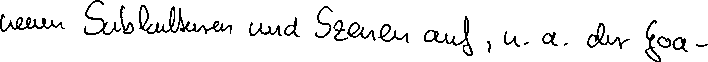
neuen Subkulturen und Szenen auf, u. a. der Goa-
